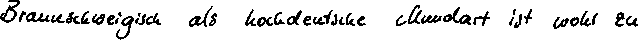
Braunschweigisch als hochdeutsche Mundart ist wohl zu
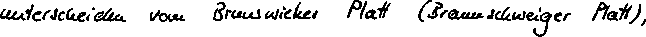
unterscheiden vom Brunswieker Platt (Braunschweiger Platt),
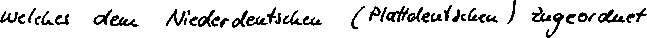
welches dem Niederdeutschen (Plattdeutschen) zugeordnet
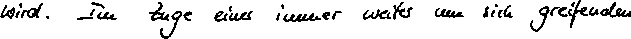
wird. Im Zuge einer immer weiter um sich greifenden
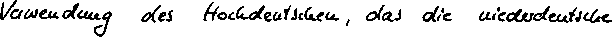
Verwendung des Hochdeutschen, das die niederdeutsche
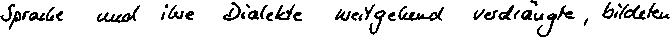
Sprache und ihre Dialekte weitgehend verdrängte, bildeten
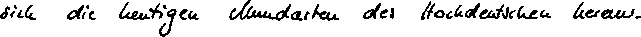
sich die heutigen Mundarten des Hochdeutschen heraus.
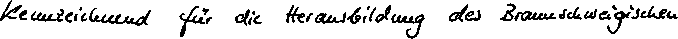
Kennzeichnend für die Herausbildung des Braunschweigischen
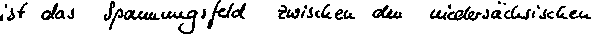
ist das Spannungsfeld zwischen den niedersächsischen
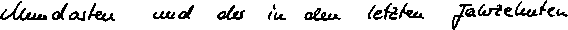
Mundarten und der in den letzten Jahrzehnten
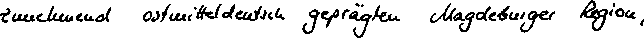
zunehmend ostmitteldeutsch geprägten Magdeburger Region,
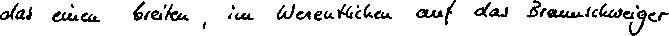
das einen breiten, im Wesentlichen auf das Braunschweiger
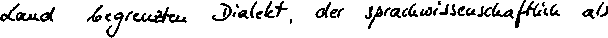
Land begrenzten Dialekt, der sprachwissenschaftlich als
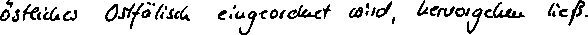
östliches Ostfälisch eingeordnet wird, hervorgehen ließ.
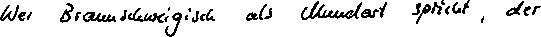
Wer Braunschweigisch als Mundart spricht, der
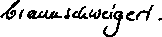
braunschweigert.
